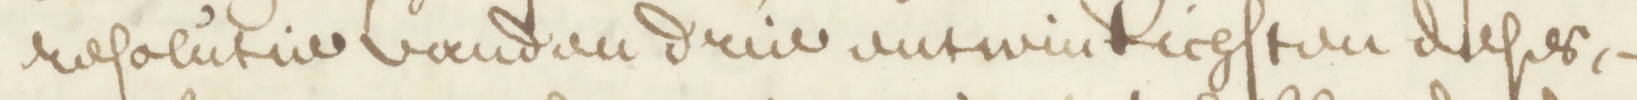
resolutie vanden drie entwintichsten deses,
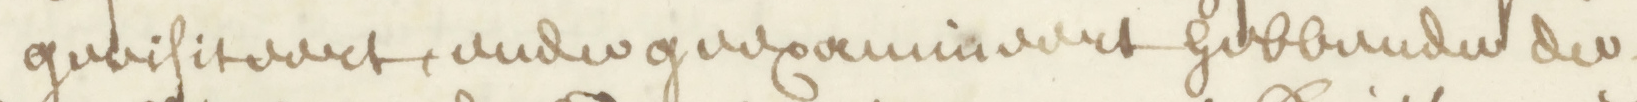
gevisiteert, ende geexamineert hebbende de
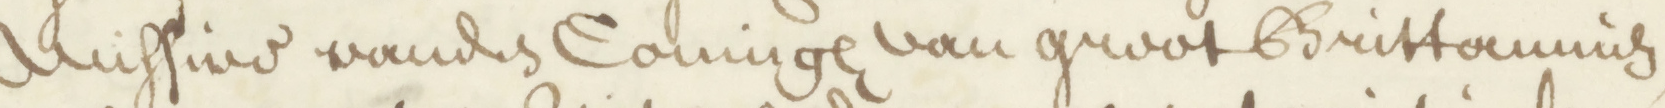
Missive vanden Coningh van groot Brittannien,
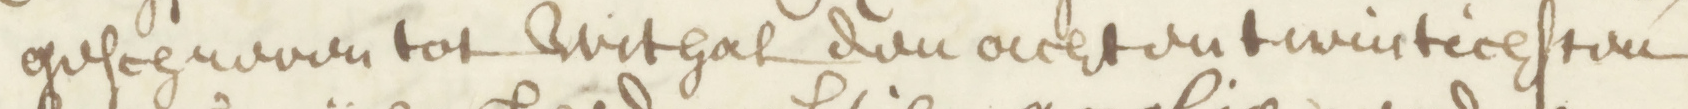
geschreven tot Withal den achtentwintichsten
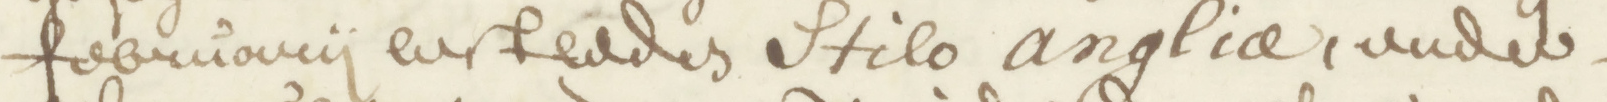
februarij lestleden Stilo angliæ, ende
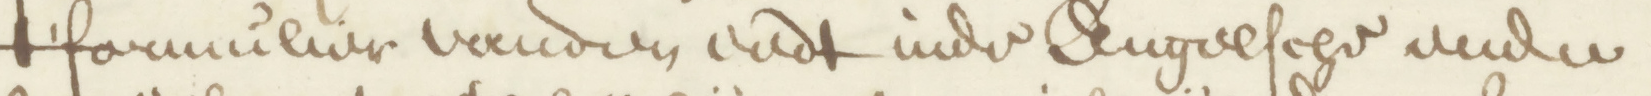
t‛formulier vanden eedt inde Engelsche ende
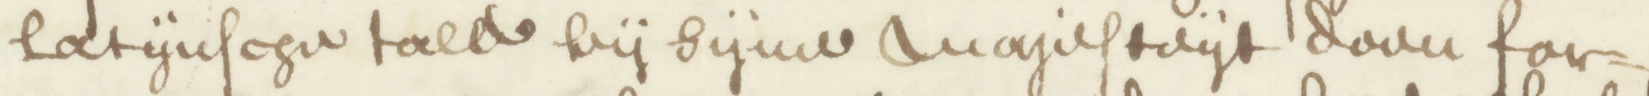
latijnsche tale bij sijne Majesteijt doen for„
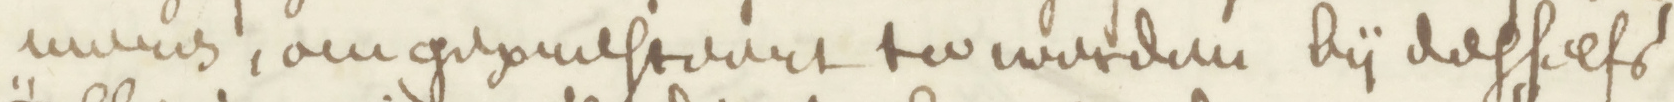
„meren, om gepresteert te werden bij desselfs
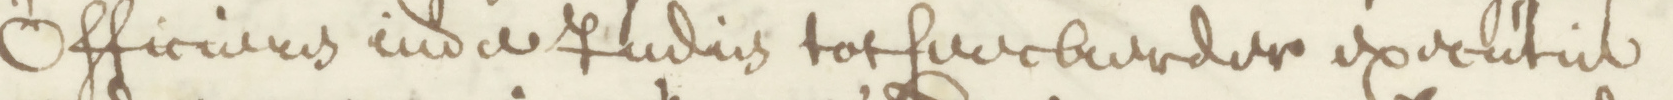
Officieren inde Indien tot seeckerder executie
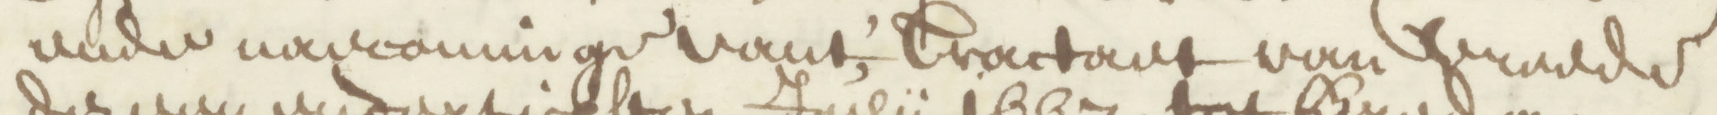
ende naecominge vant‛ Tractaet van Vreede
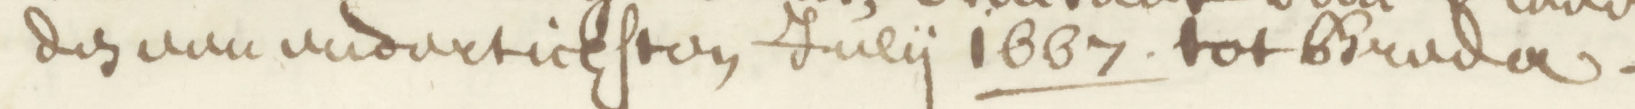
den een endertichsten Julij 1667 tot Breda
